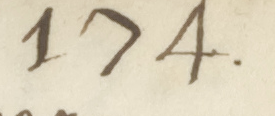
174.
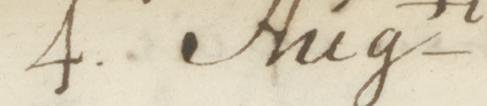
4. Augsti
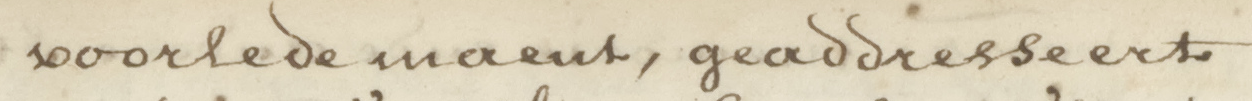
voorlede maent, geaddresseert
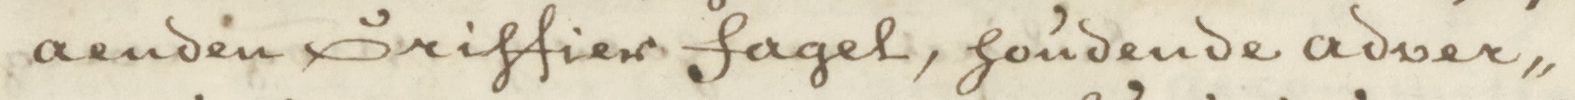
aenden Griffier Fagel, houdende adver„
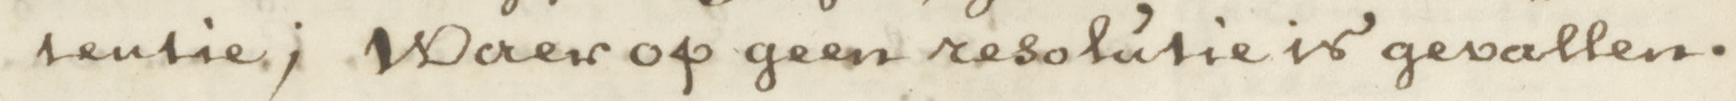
tentie; Waer op geen resolutie is gevallen.
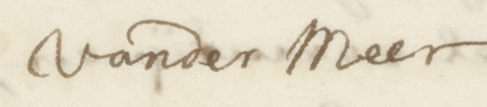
vander Meer
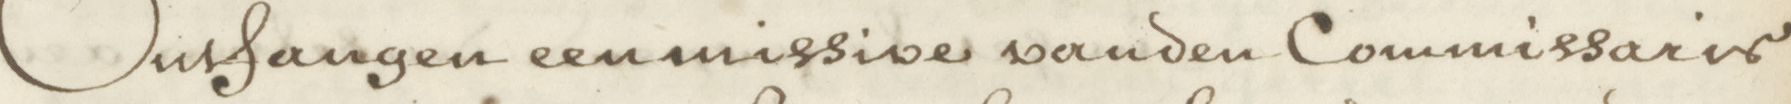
Ontfangen een missive vanden Commissaris
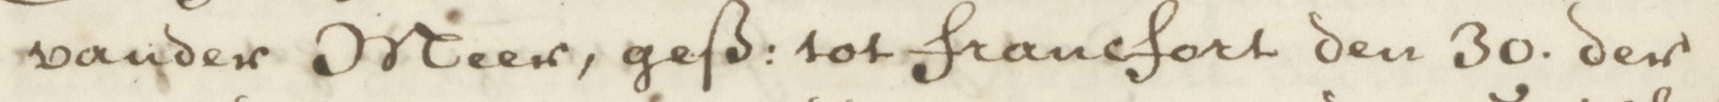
vander Meer, ges: tot Francfort den 30. der
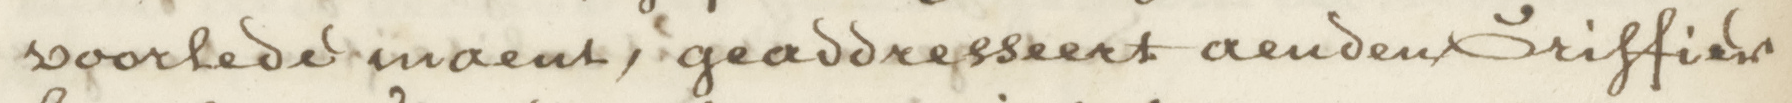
voorlede maent, geaddresseert aenden Griffier
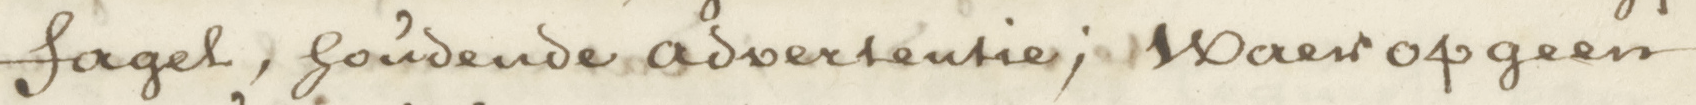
Fagel, houdende advertentie; Waer op geen
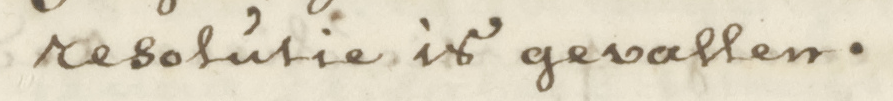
resolutie is gevallen.
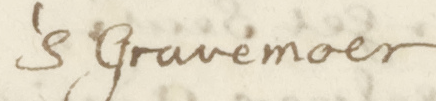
‛s Gravemoer
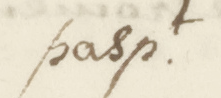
paspt.
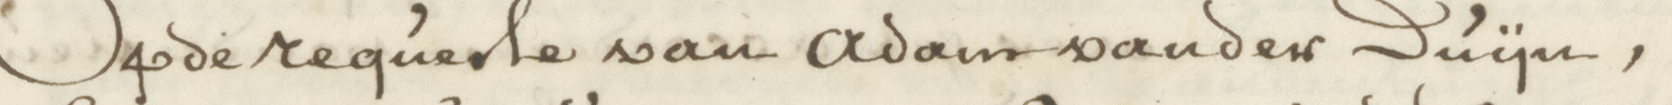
Opde requeste van Adam vander Duijn,
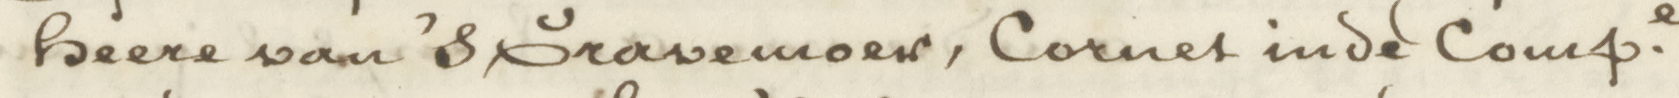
heere van ‛s Gravemoer, Cornet inde Compe.
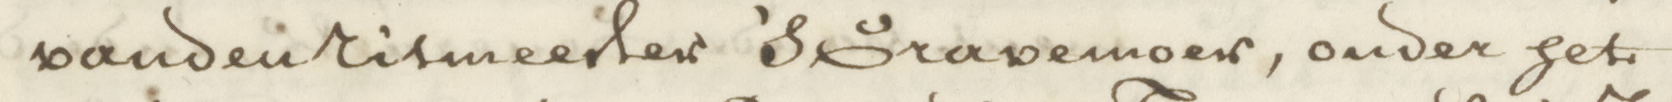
vanden ritmeester ‛s Gravemoer, onder het
